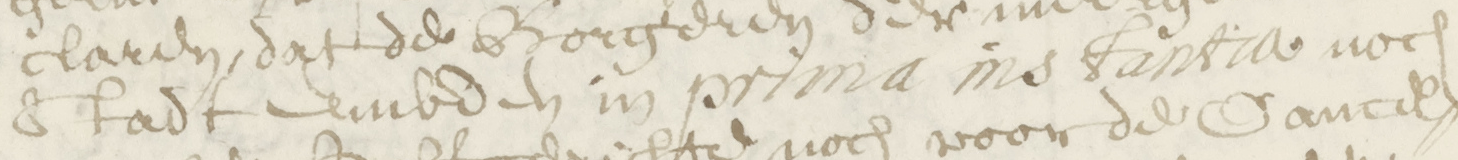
Stadt Embden, in prima instantia noch
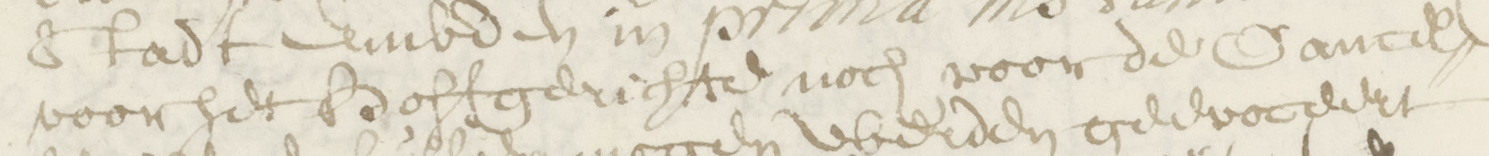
voor het Hoffgerichte noch voor de Cancel„
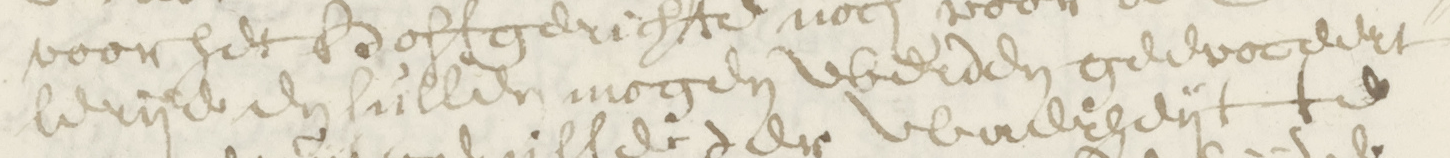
lerije en sullen mogen werden geevoceert
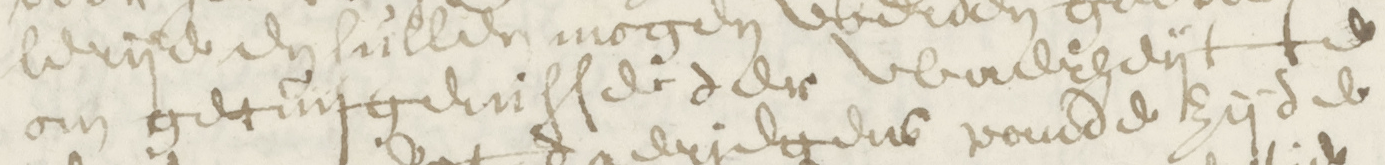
om getuijgenisse der waerheijt te
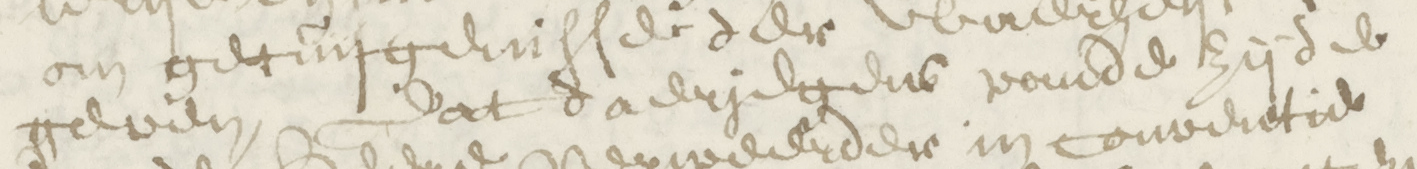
geven, Dat daerjegens vande zijde
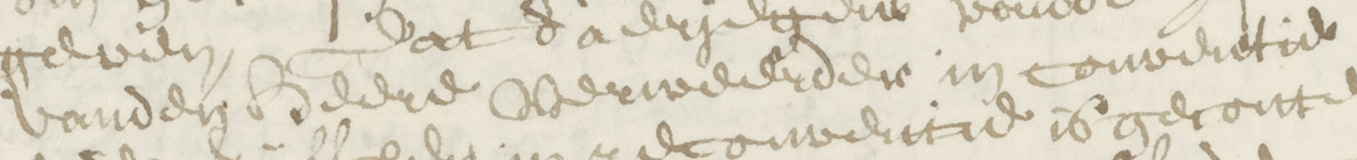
vanden Heere Verweerder in conventie
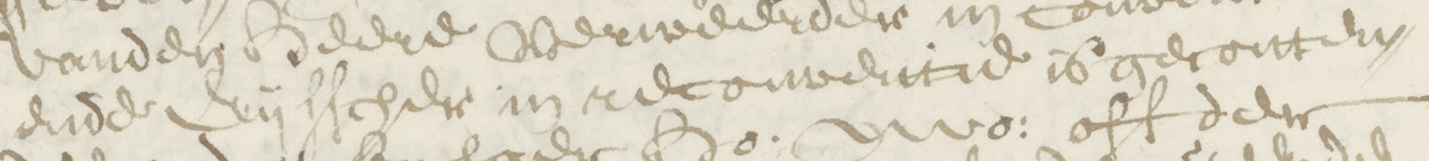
ende Eijsscher in reconventie is geconten„
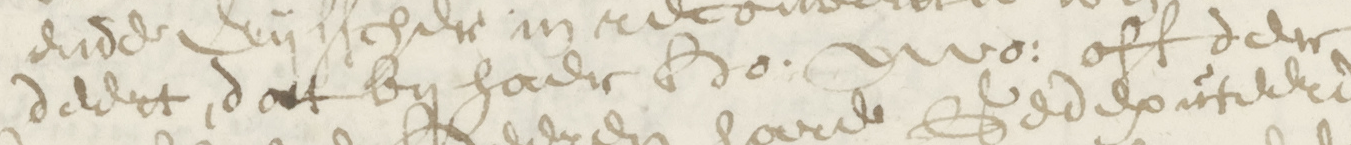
deert, dat bij haer Ho:Mo: off der
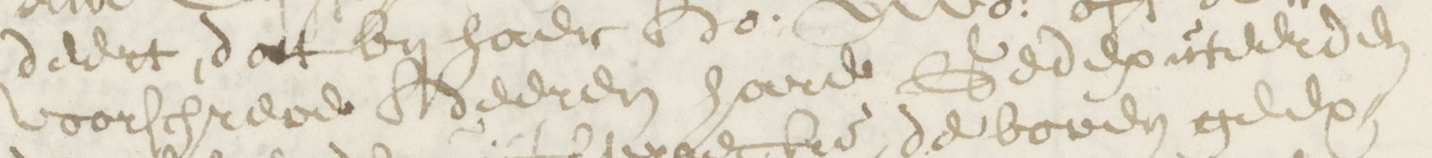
voorschreve Heeren hare Gedeputeerden
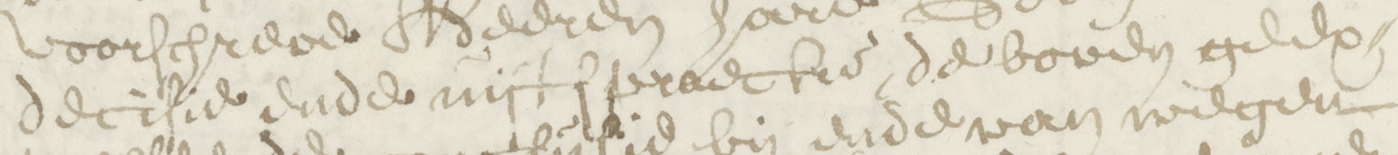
decisie ende uijtspraecke, de boven geex„
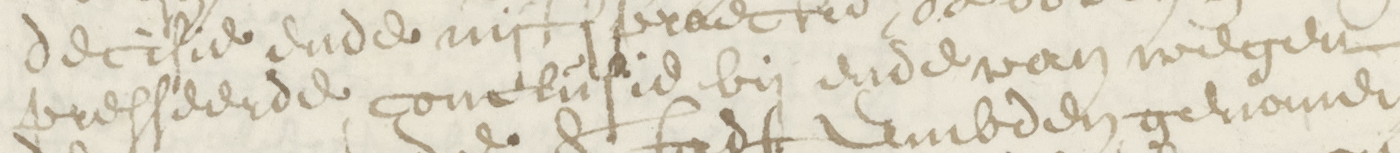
presseerde conclusie bij ende van wegen
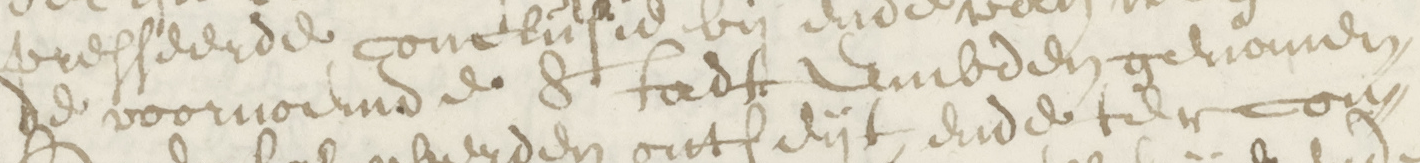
de voornoemde Stadt Embden genomen,
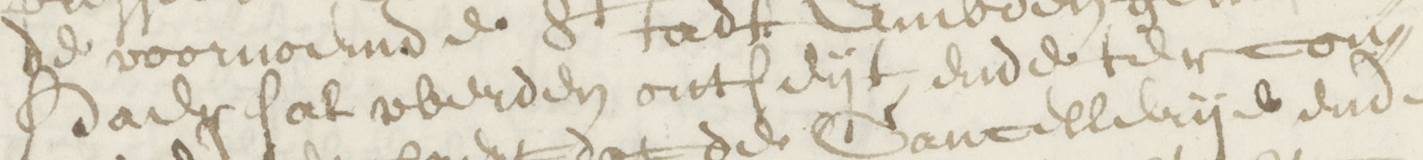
Haer sal werden ontseijt, ende ter con„
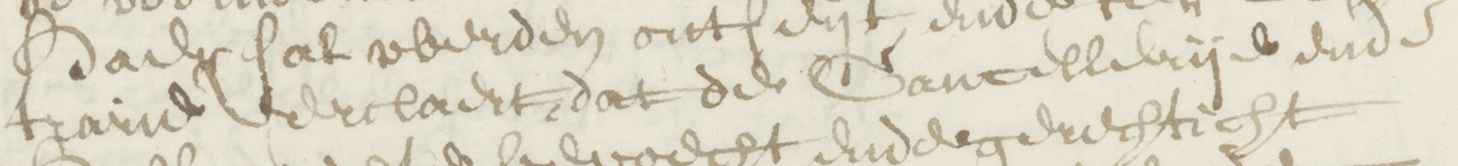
trarie verclaert de Cancellerije ende
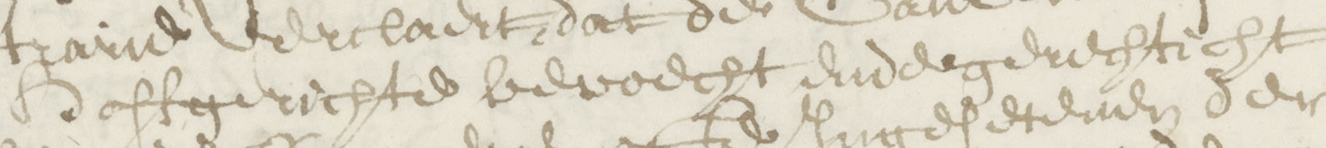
Hoffgerichte bevoecht ende gerechticht
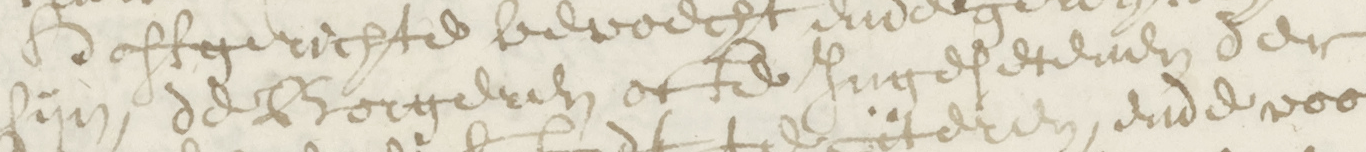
sijn, de Borgeren ofte Ingesetenen der
